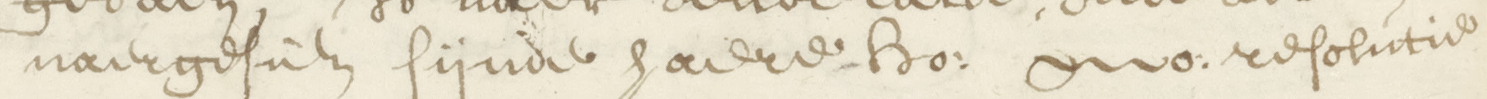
naergesien sijnde haere Ho:Mo: resolutie
